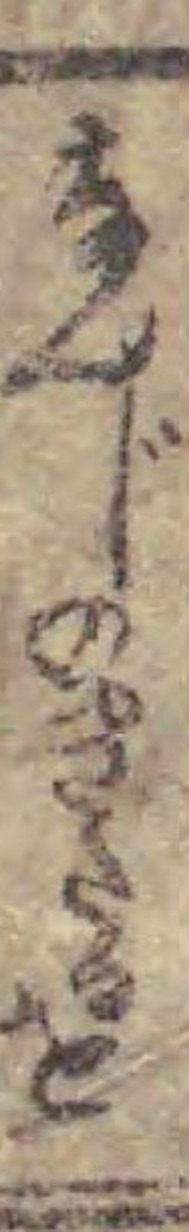なんじのきたるを
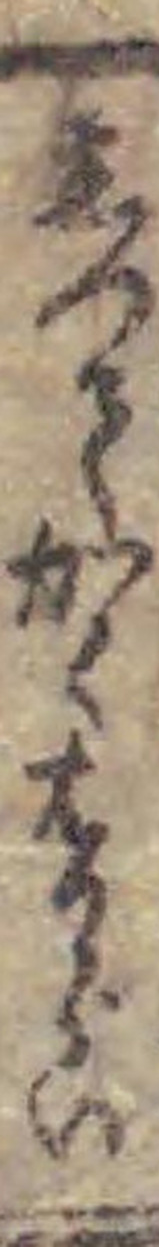しつてかくはからい
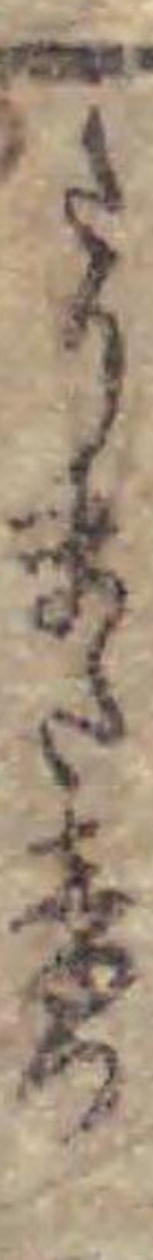たりまたしゆつ
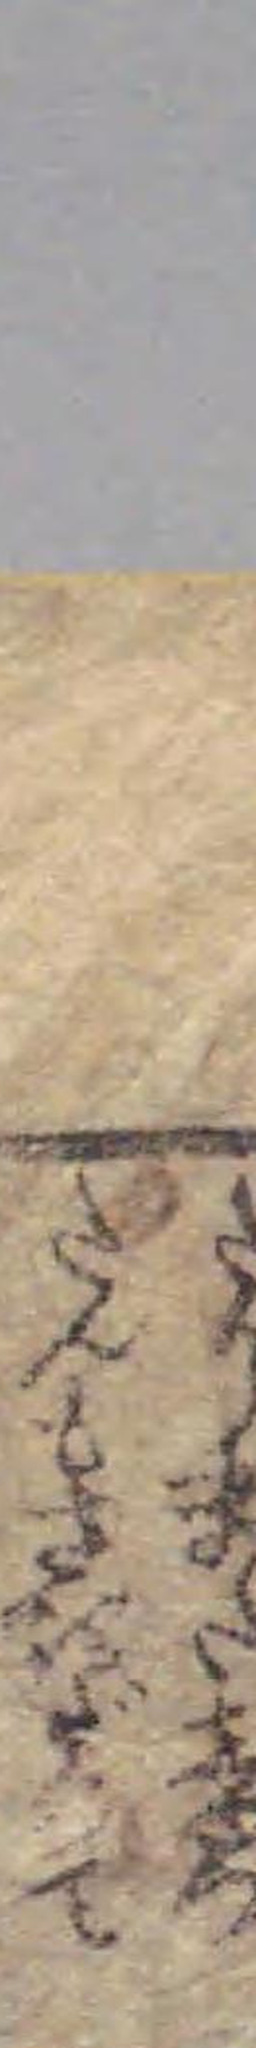たんもさきだつて
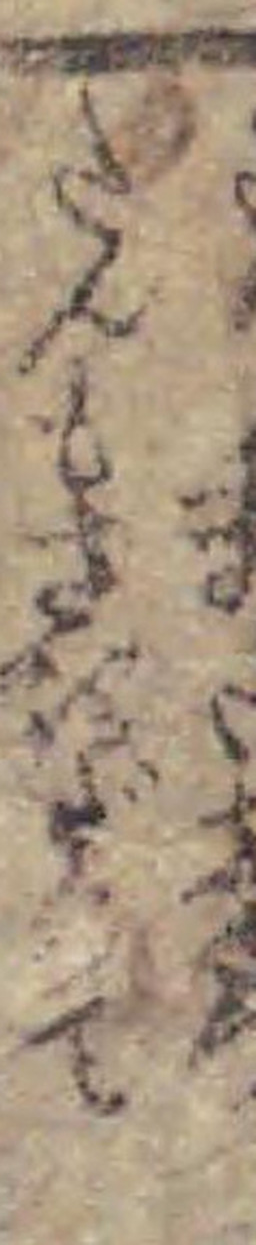たんもさきだつて
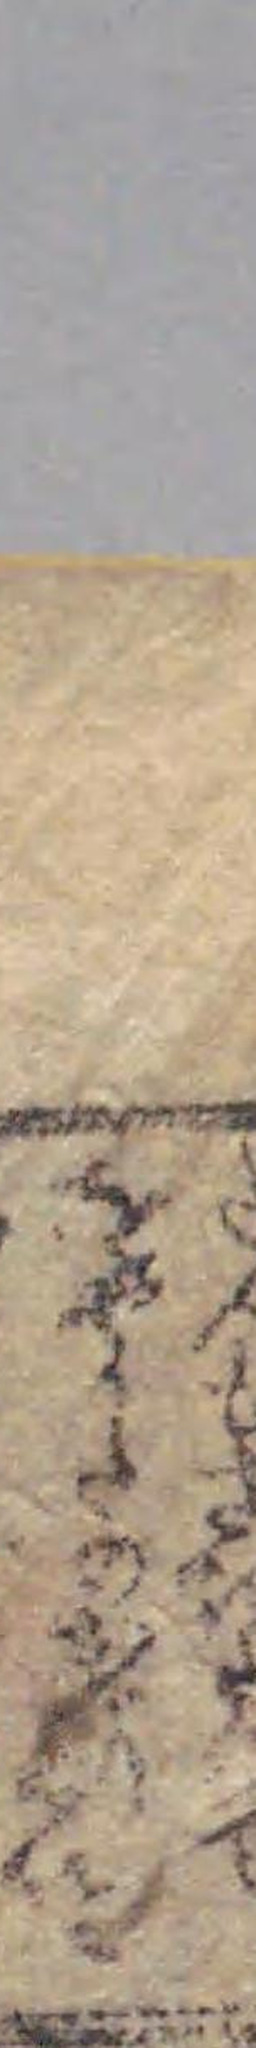をやかたを
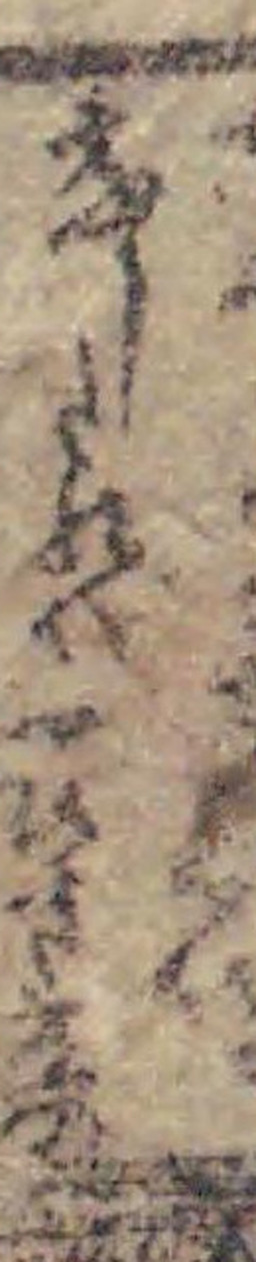なしたれは一ひきの
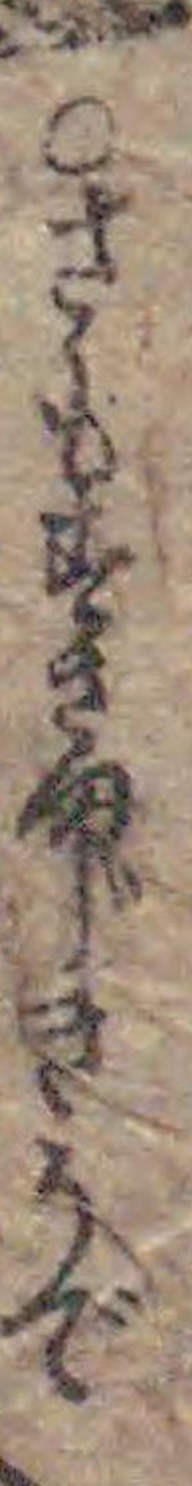○さもすさまじきうで
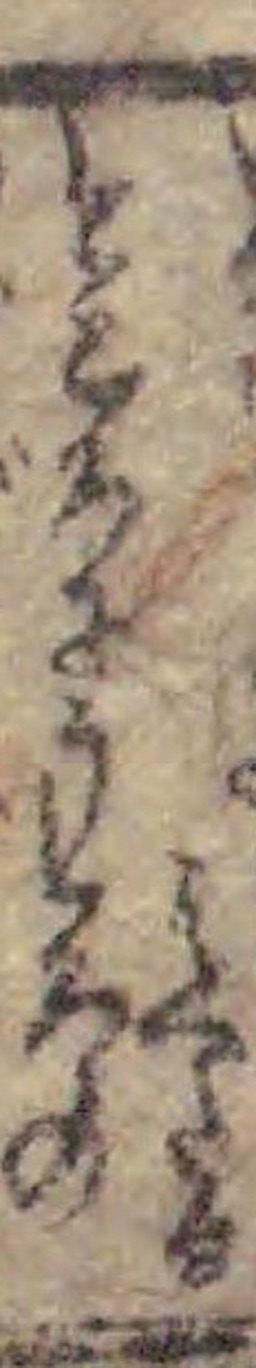ところにうしろの
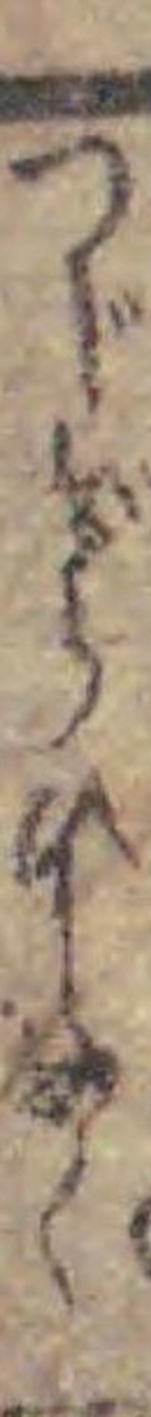つじどうひしめく
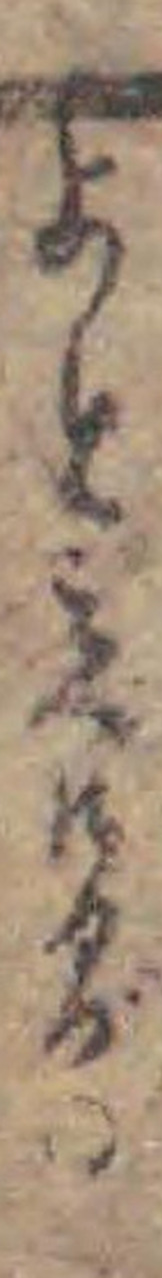よとみへけるが○

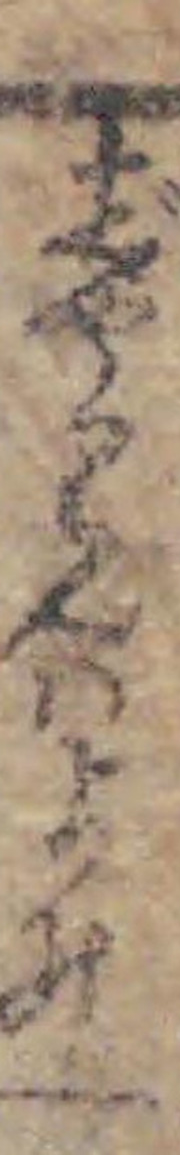じやりんはよみ
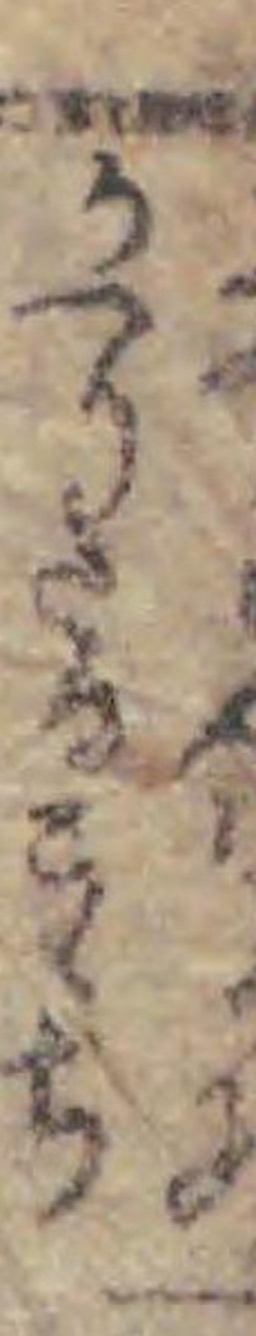かへりたるこゝち
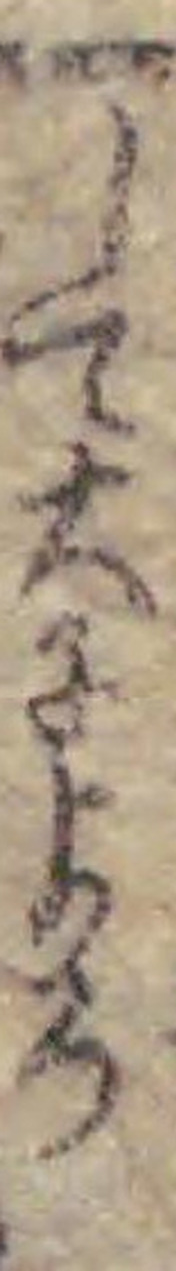して大によろ
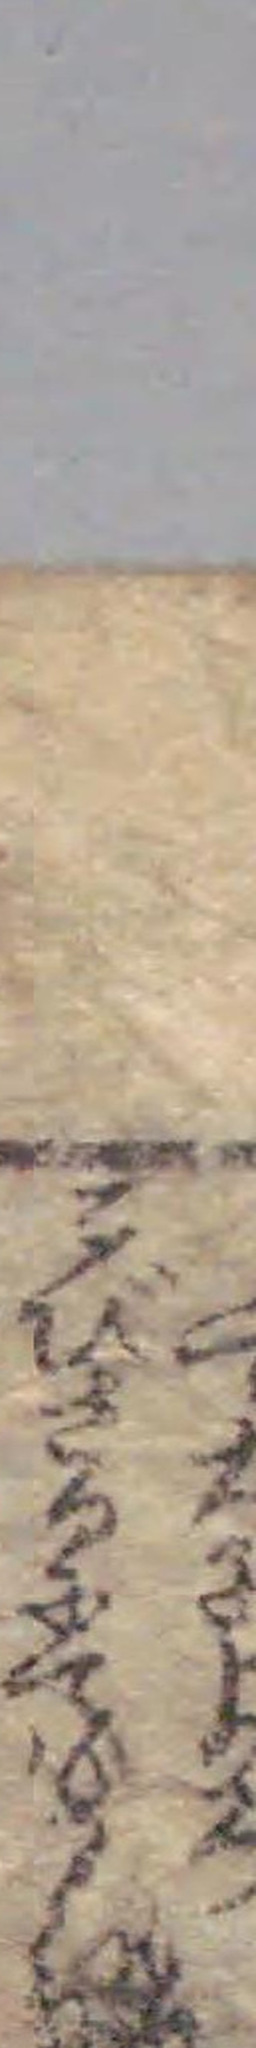こびさるにても
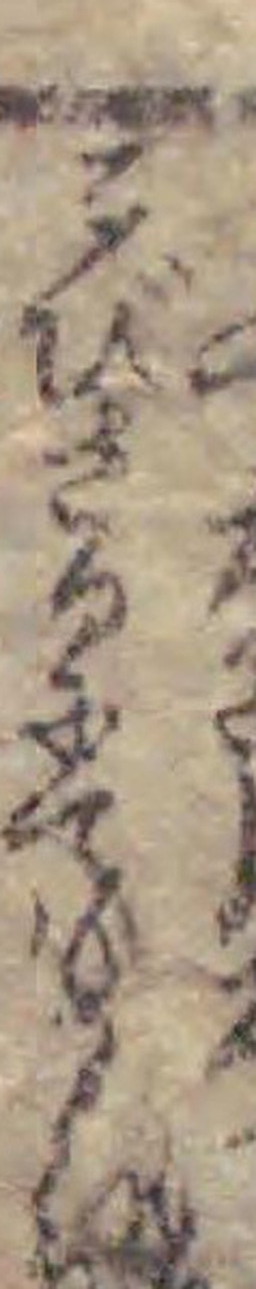こびさるにても
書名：化物世界夜半嵐 : 3巻
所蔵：国立国会図書館 National Diet Library, JAPAN
